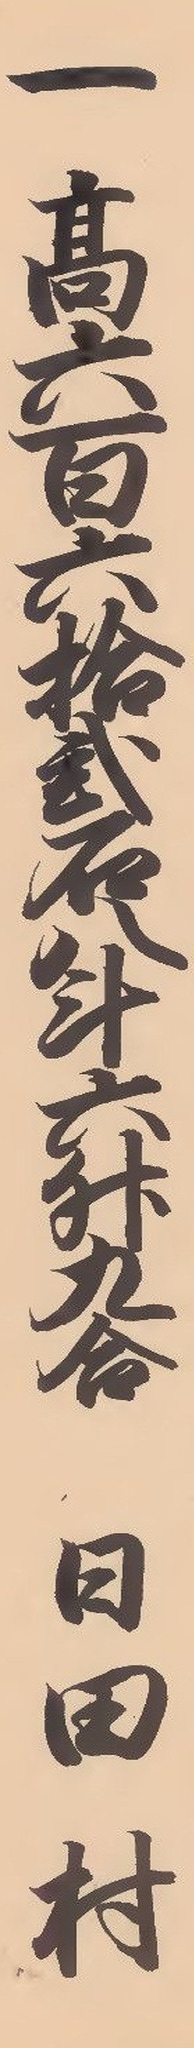一高六百六拾弐石八斗六升九合日田村

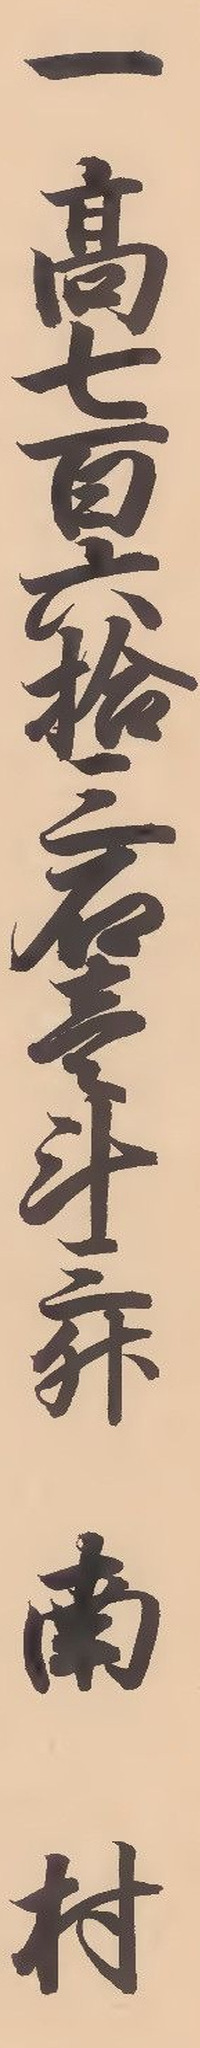一高七百六拾三石壱斗三升南村
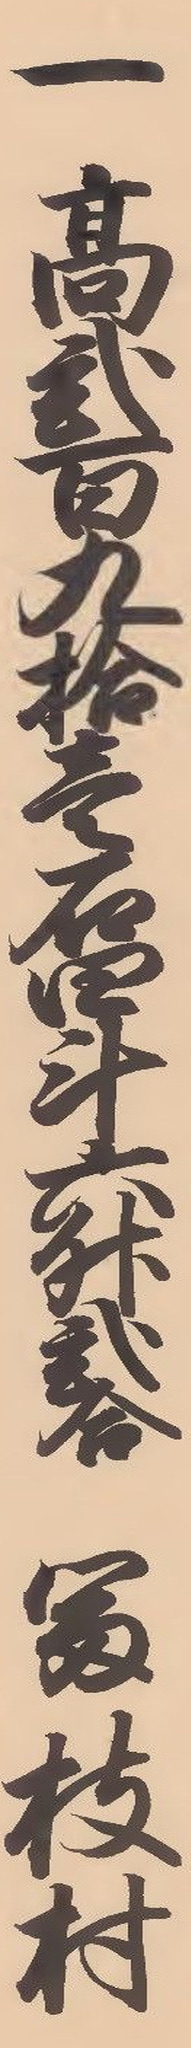一高弐百九拾壱石四斗六升弐合富枝村
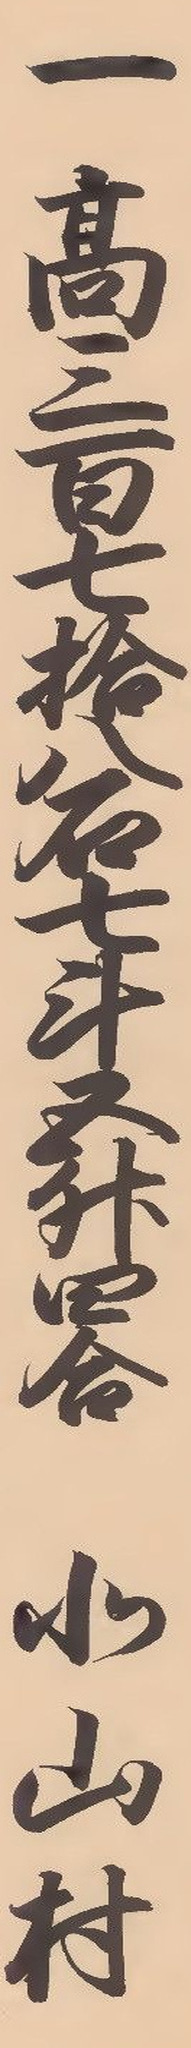一高三百七拾八石七斗五升四合北山村
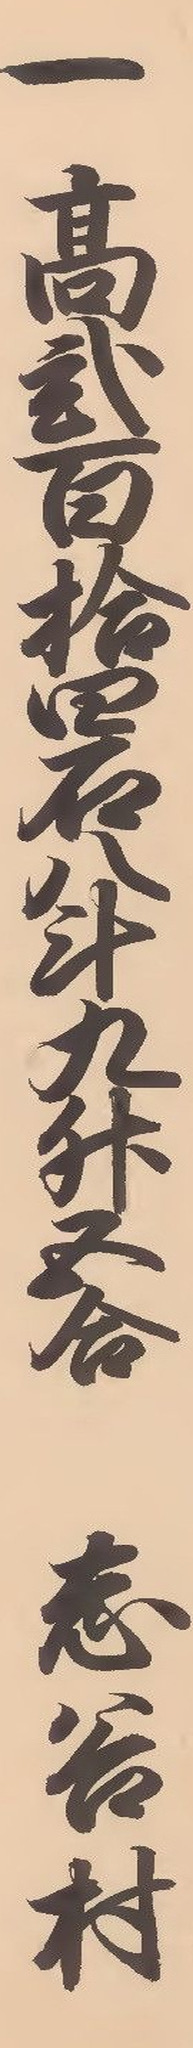一高弐百拾四石八斗九升五合志谷村
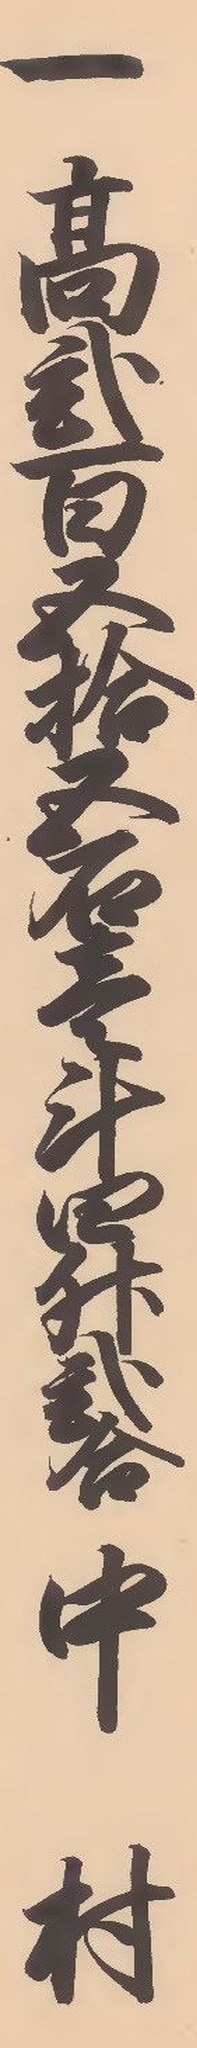一高弐百五拾五石壱斗四升弐合中村
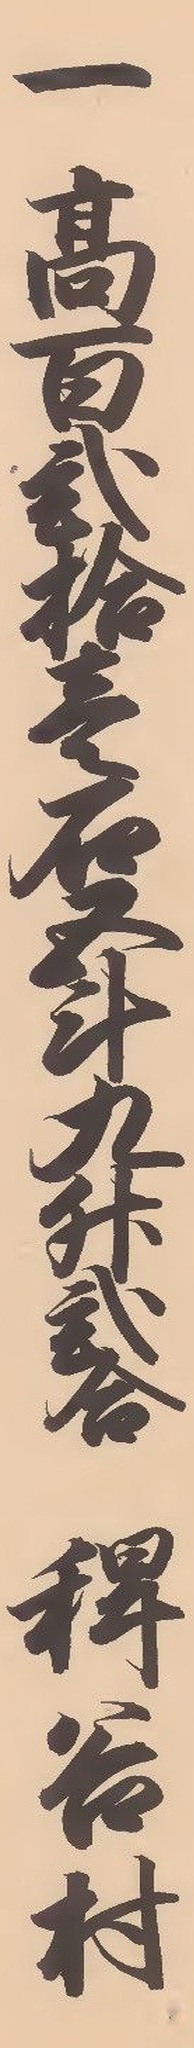一高百弐拾壱石五斗九升弐合稗谷村
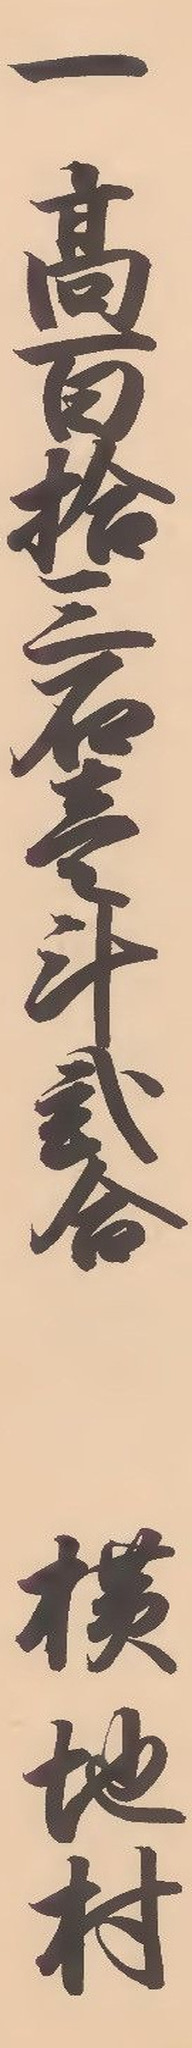一高百拾三石壱斗弐合横地村

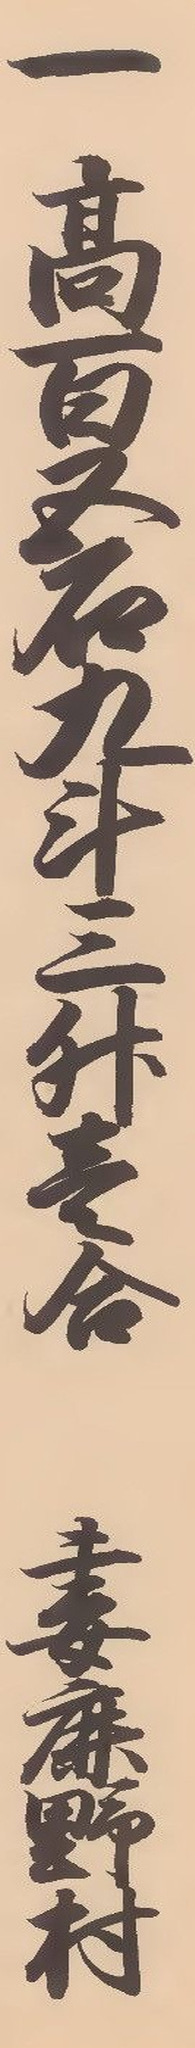一高百五石九斗三升壱合妻鹿野村
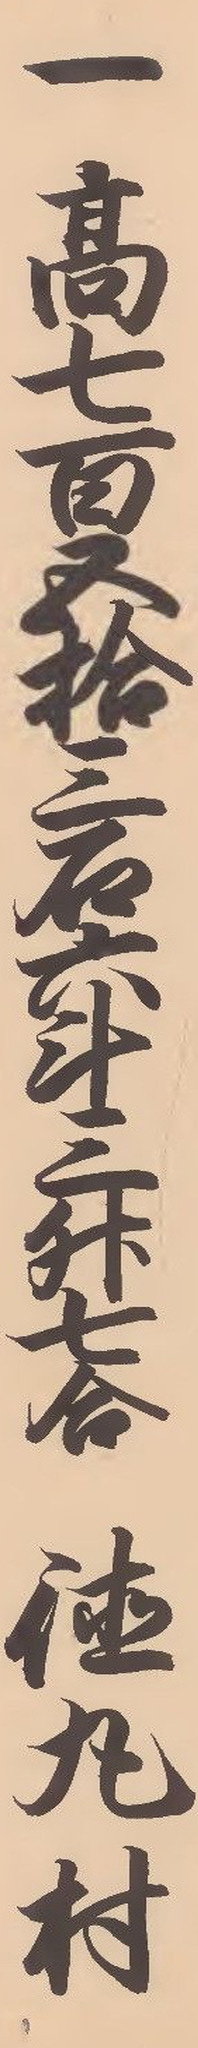一高七百五拾三石六斗三升七合徳丸村
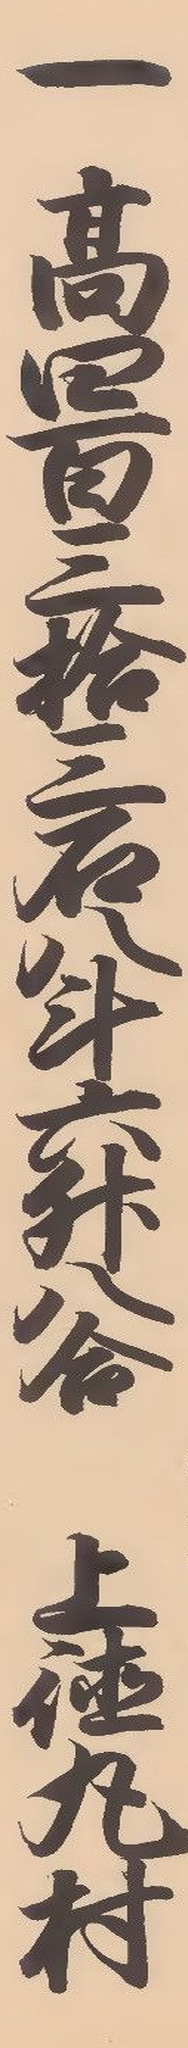一高七百五拾三石六斗三升七合徳丸村
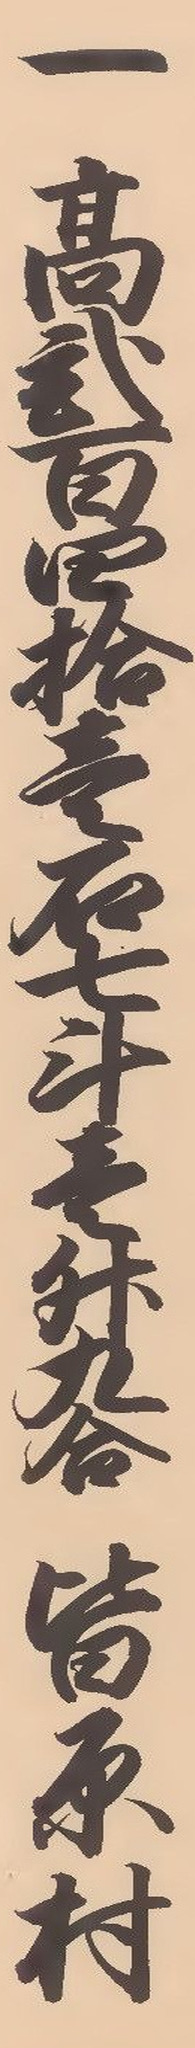一高弐百四拾壱石七斗壱升九合皆原村
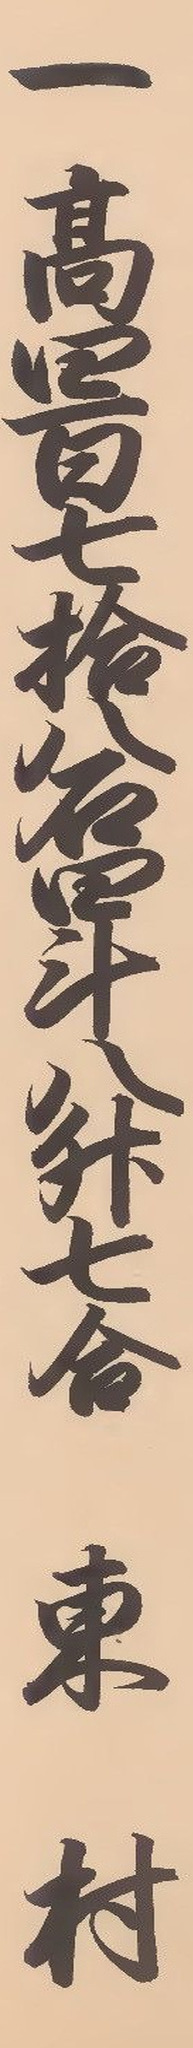一高四百七拾八石四斗八升七合東村
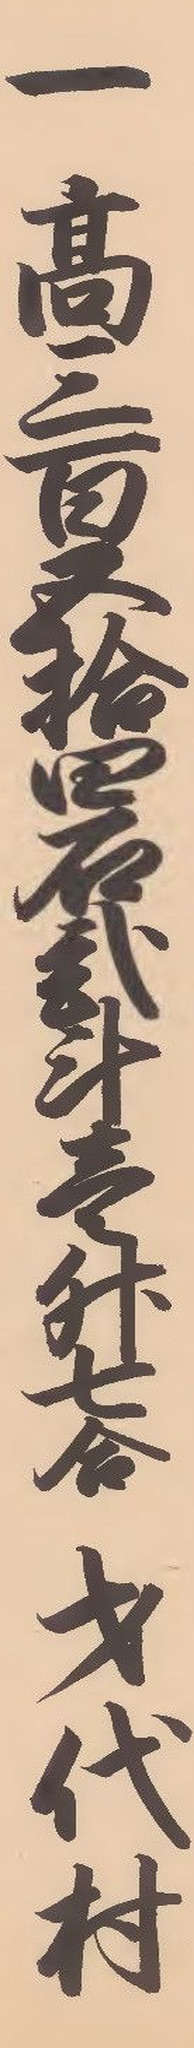一高三百五拾四石弐斗壱升七合才代村
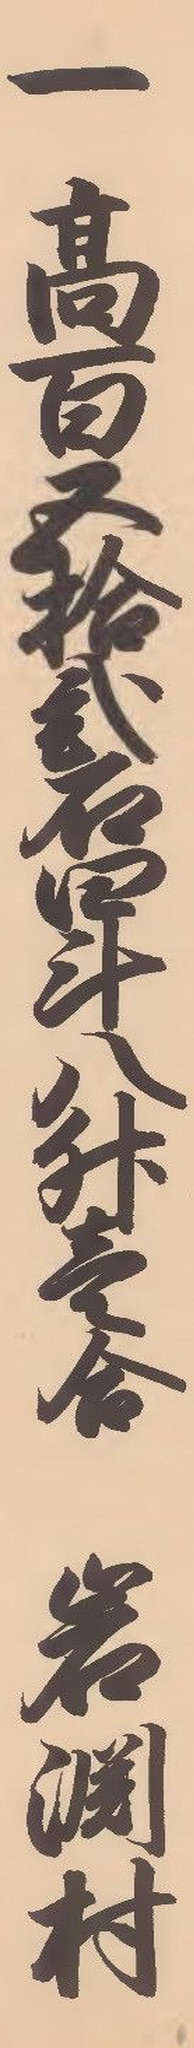一高百五拾弐石四斗八升壱合岩渕村
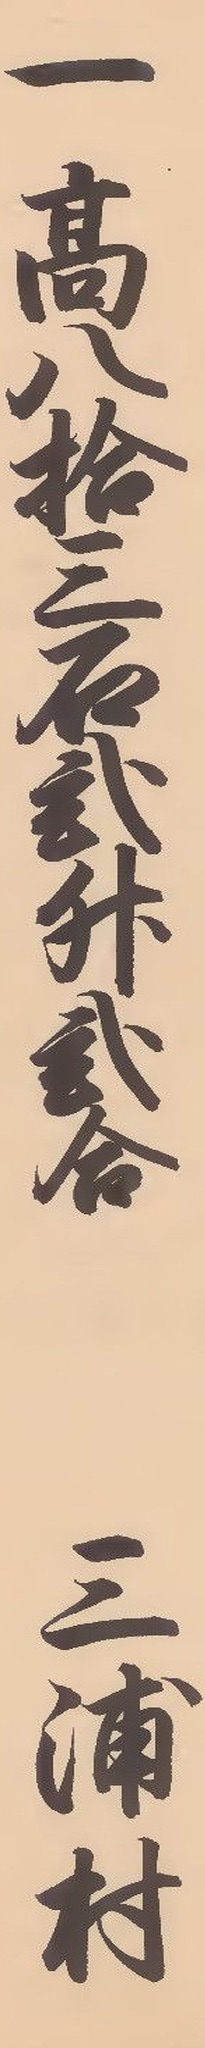一高八拾三石弐升弐合三浦村
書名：因幡国郷帳
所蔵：国立公文書館 National Archives of Japan
